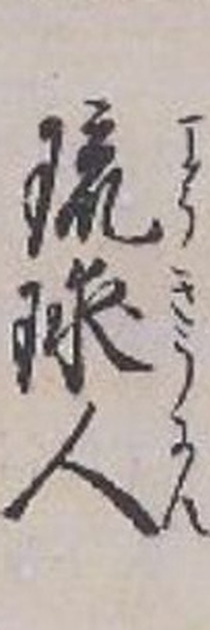琉球人
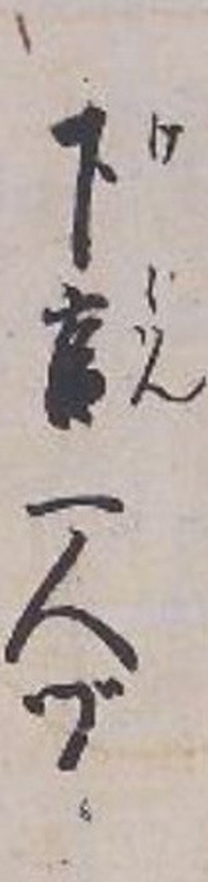下官一人づゝ

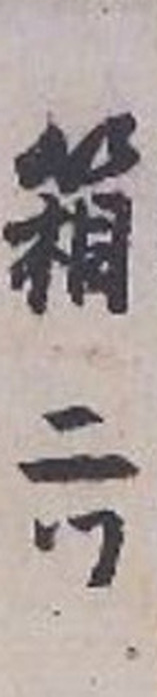箱二つ
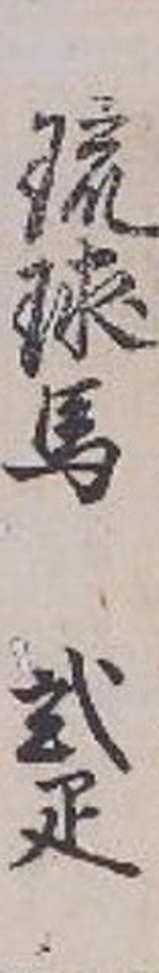琉球馬弐疋
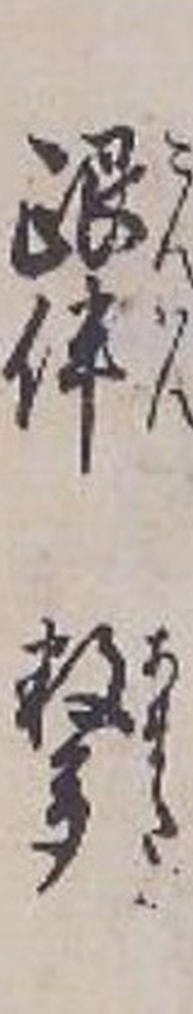跟伴数多
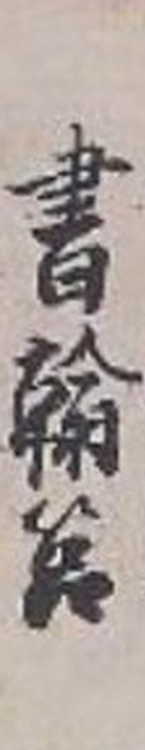書翰箱

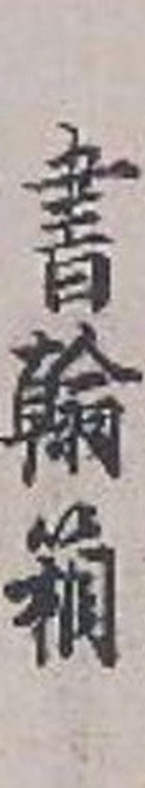書翰箱
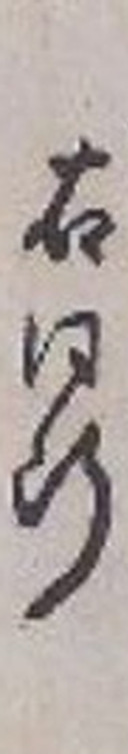右同行
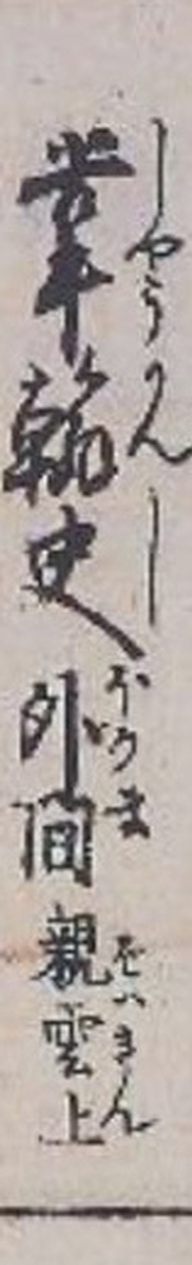掌翰史外間親雲上
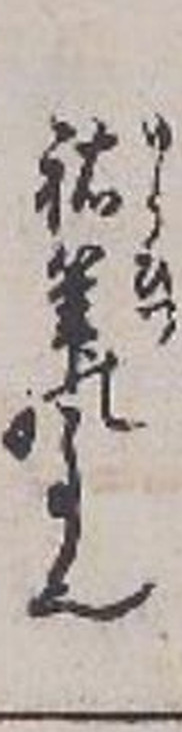祐筆の事也
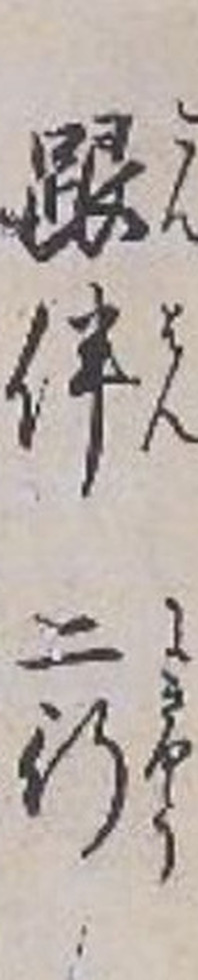跟伴二行
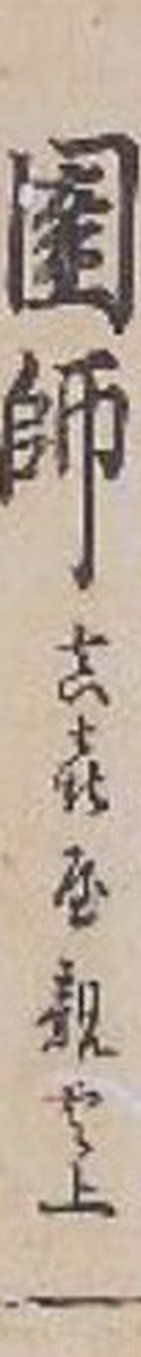圉師真喜屋親雲上
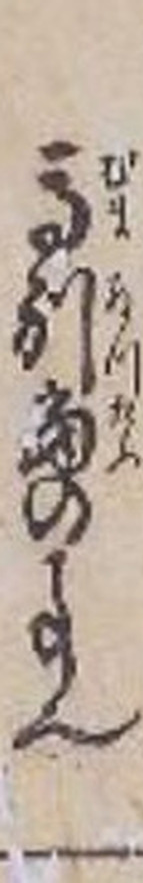馬別当の事也
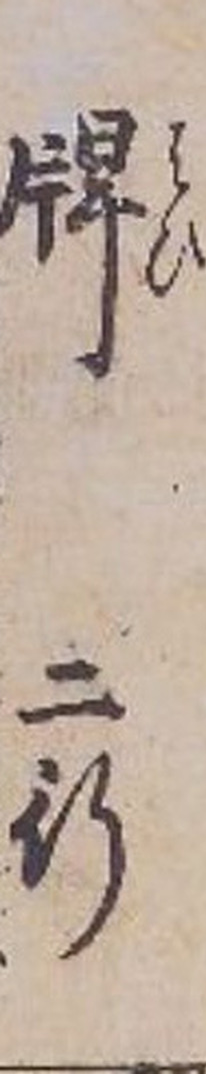牌二行
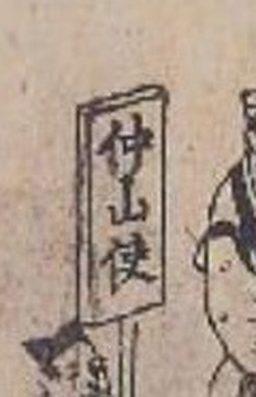仲山使

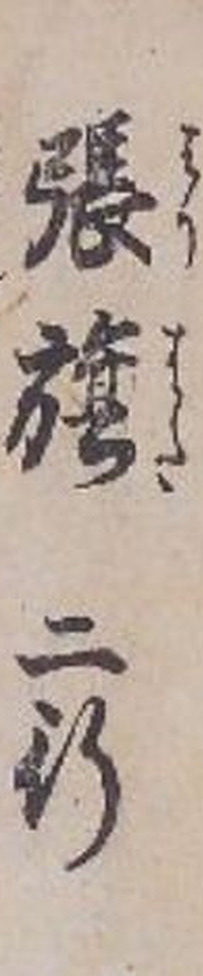張旗二行
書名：琉球人大行列記 来朝新板絵入
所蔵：University of the Ryukyus Library
